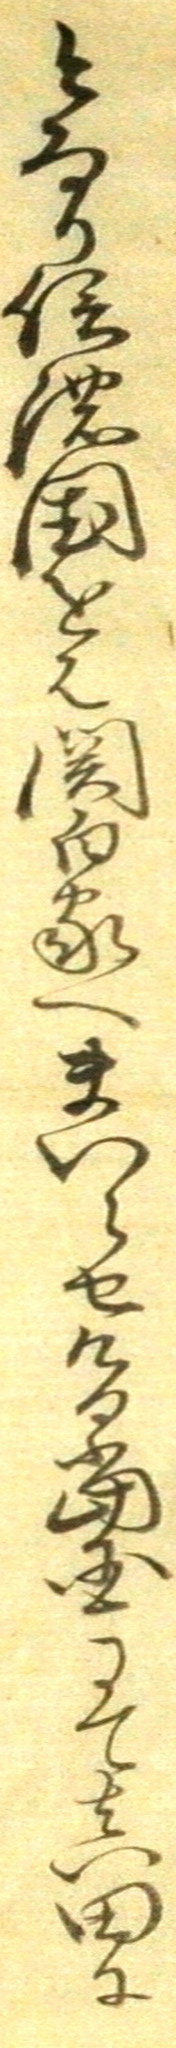となり信濃国をは関白家へまいらせける当国にて真田に
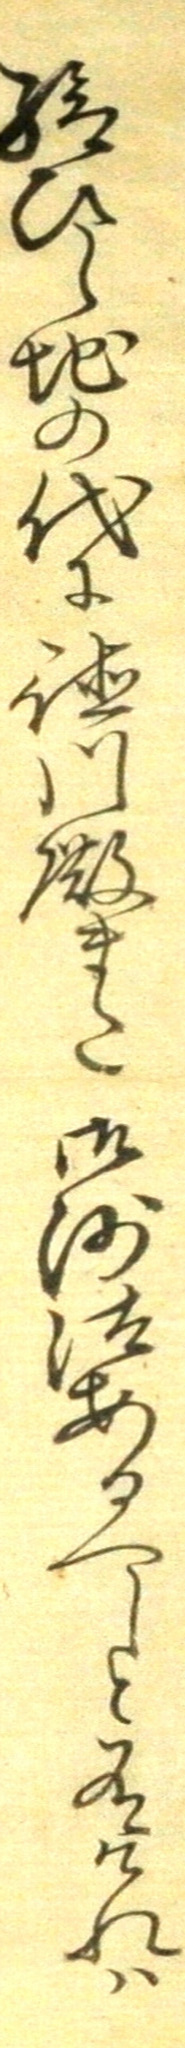給ひし地の代に徳川殿また御沙汰あるへしと有けれは
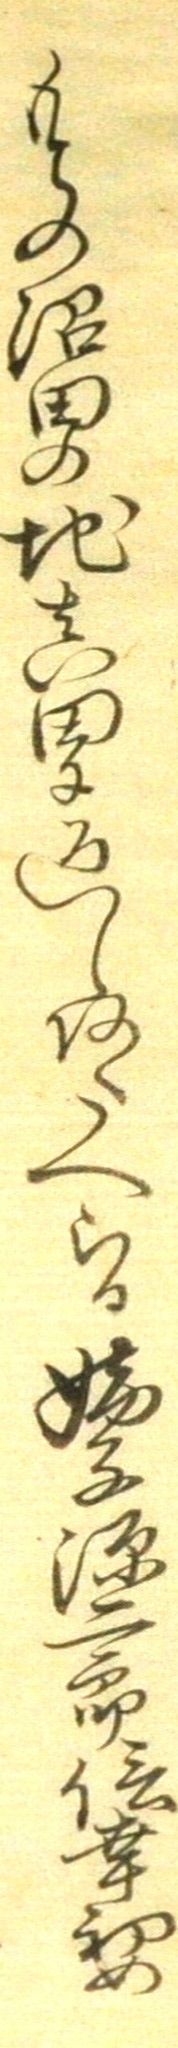もとの沼田の地真田に返しあたへらる嫡子源二郎信幸初め
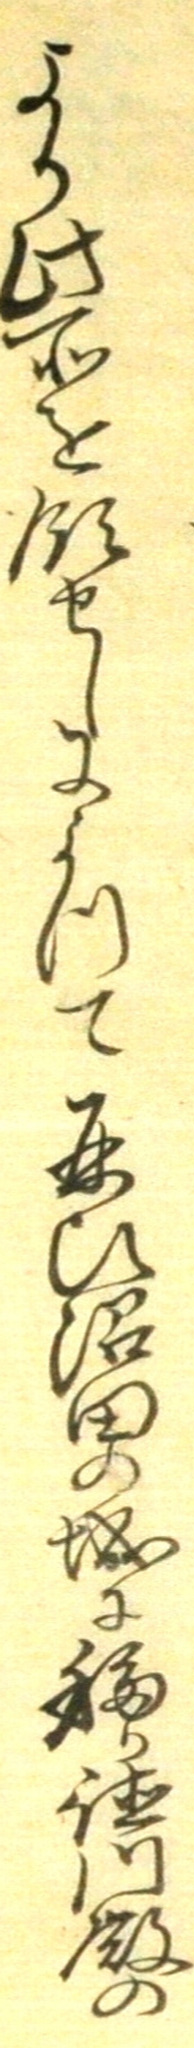より此所を領せしによつて再ひ沼田の城に移り徳川殿の
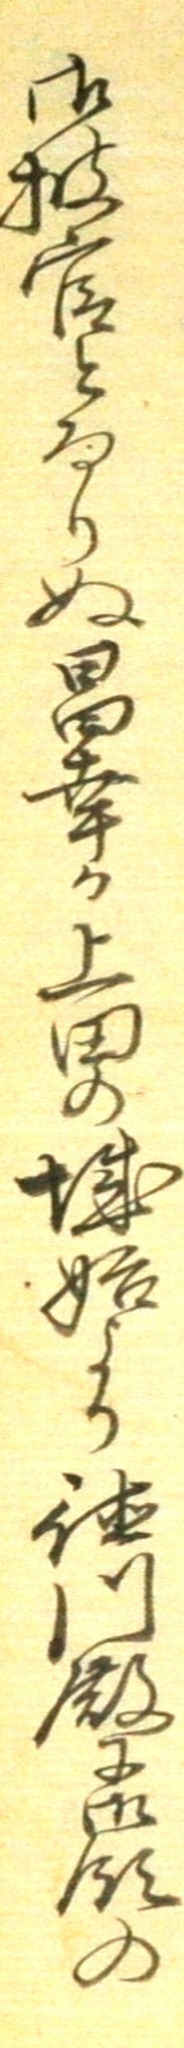御被官となりぬ昌幸か上田の城始より徳川殿に御領の
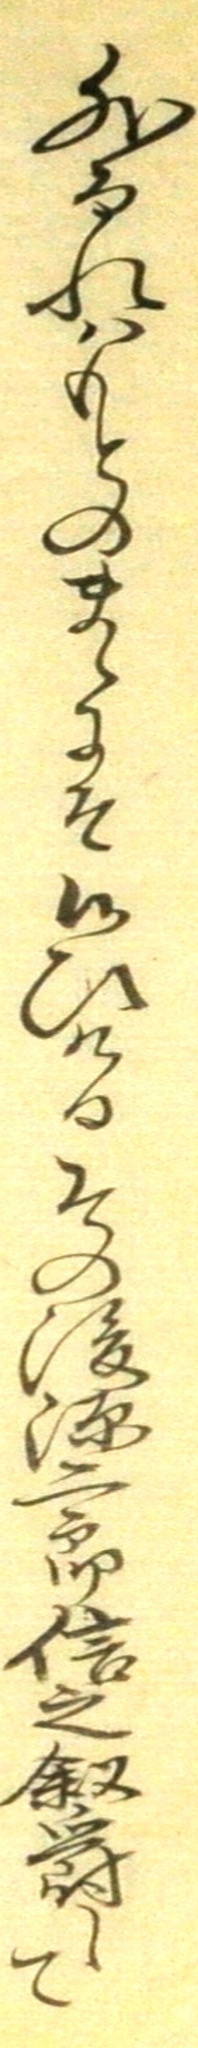外なれはもとのまゝにそ候ひけるその後源二郎信之叙爵して
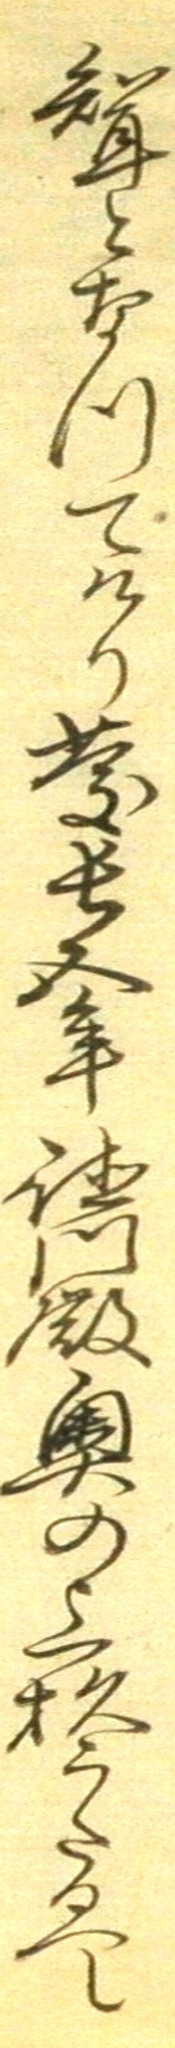聟となつてけり慶長五年徳川殿奥の上杉うたるへし
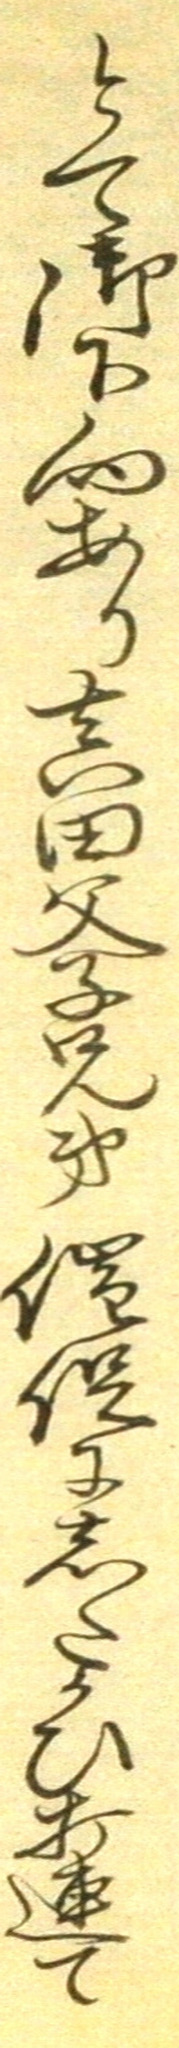とて御下向あり真田父子兄弟催促にしたかひ打連て
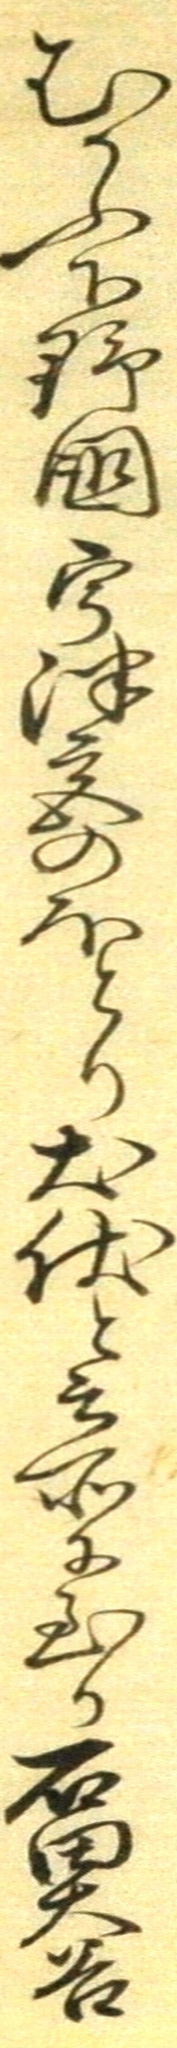むかふ下野国宇津宮のほとり犬伏と云所に至り石田大谷
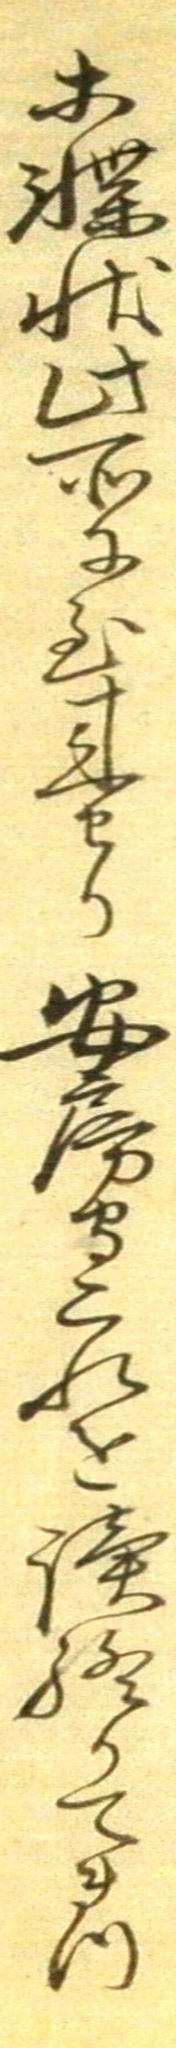等牒状此所に至来せり安房守これを読終りてまつ
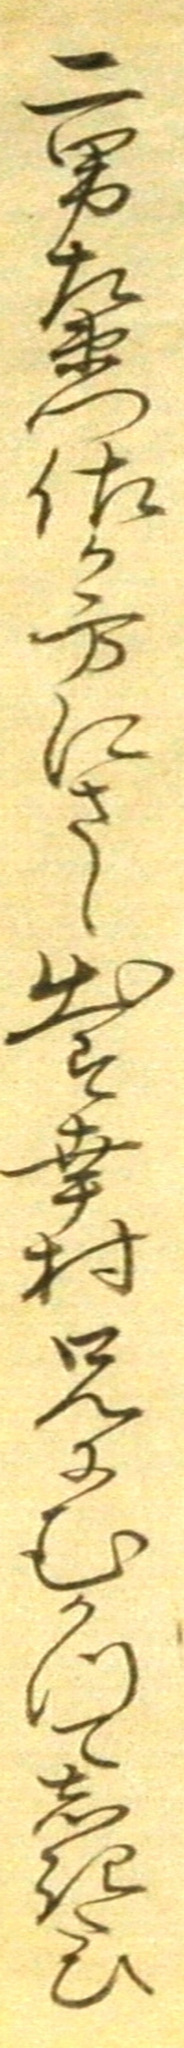二男左衛門佐か方にさし出す幸村兄にむかつてしきたひ
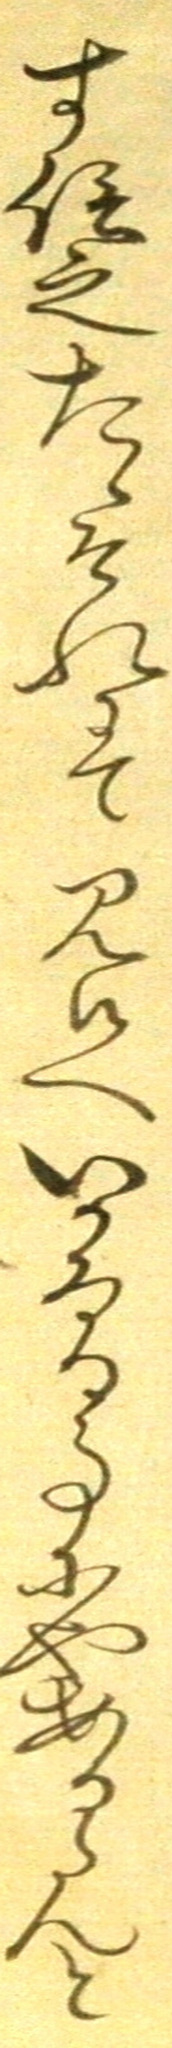す信之たゝそれにて見候へいかなる事にやあるらんと
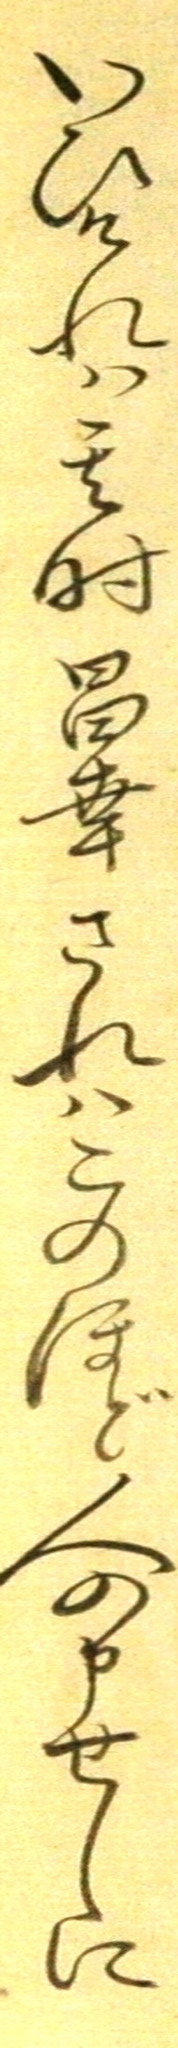いひけれは其時昌幸されはこのほど人の申せしに

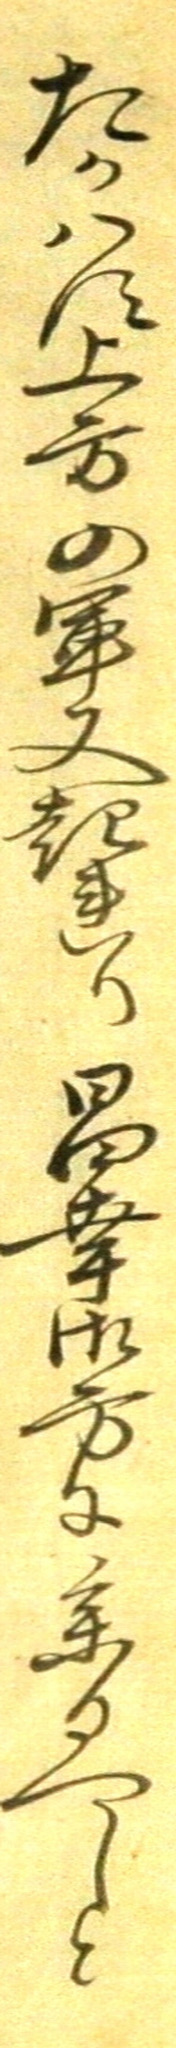たかはす上方の軍又起れり昌幸御方に参るへしと
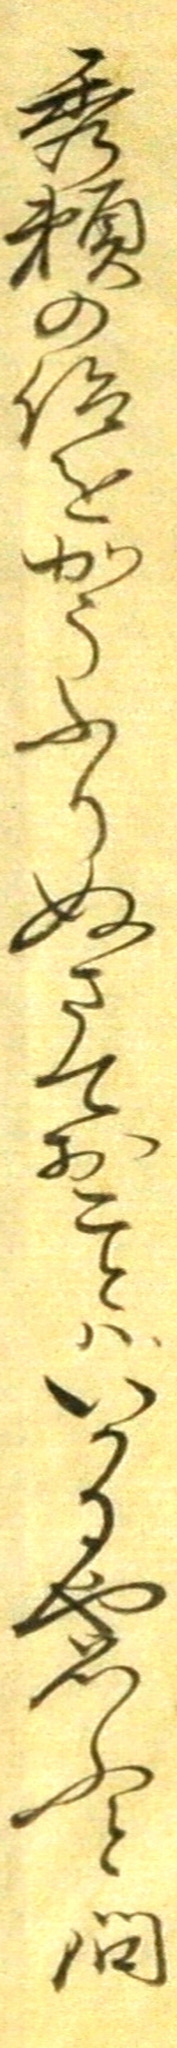秀頼の仰をかうふりぬさておことはいかにや思ふと問
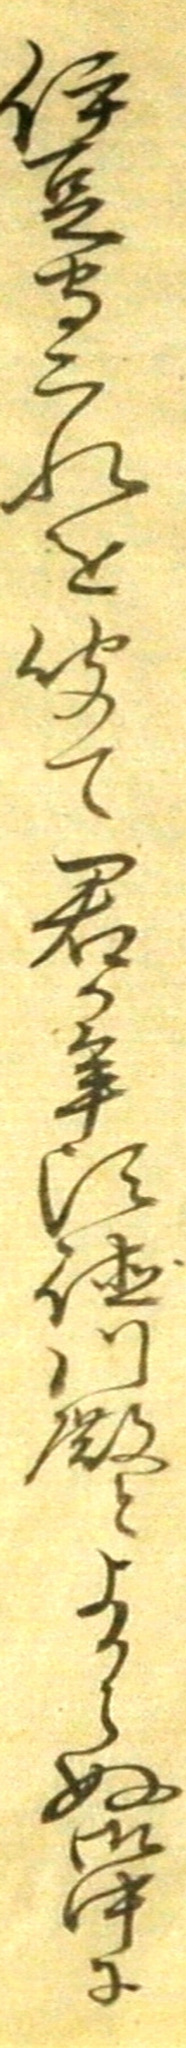伊豆守これを聞て君か年頃徳川殿とよからぬ御中に
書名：藩翰譜（九・上）
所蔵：伊那市立高遠町図書館・合同会社AMANE
